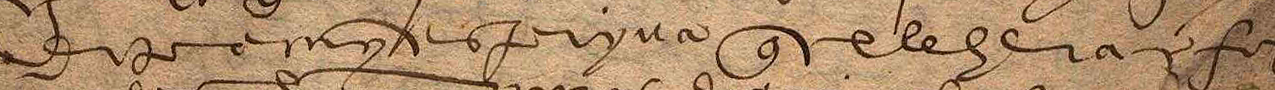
dito a mȳ espryuā q̄ elle hera ēfor
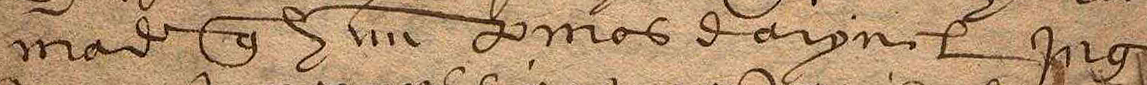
mado q̄ hūu tomas darynel Jng
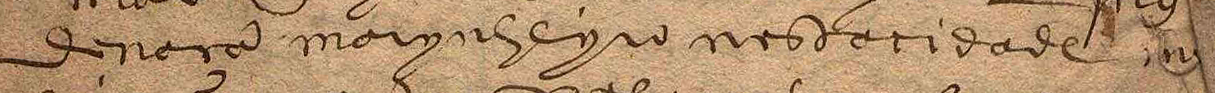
de naçā marynheyro nesta cidade m
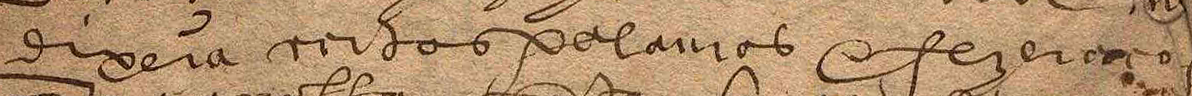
dixera certas palauras e fezera co
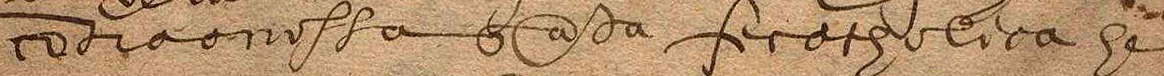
cōtra a nossa sāta fe catholica he
